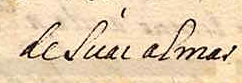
de Suas almas
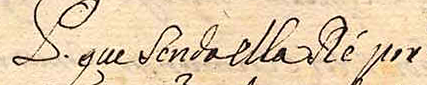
P. que Sendo ella Ré
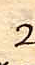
2
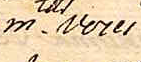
por m.tas vezes
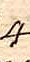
4
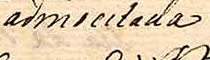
admoestada nesta
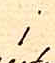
i
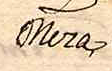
Meza,
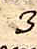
3
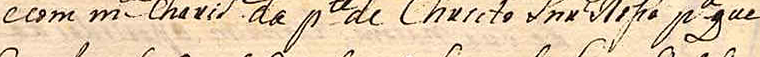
e com m.ta charid.e da pte de Christo Snr̄ Nosso p.a que
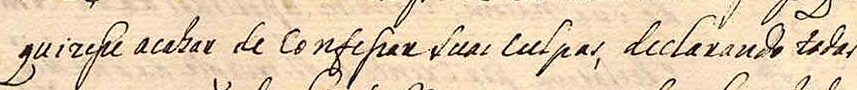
quizesse acabar de confessar suas culpas, declarando todas
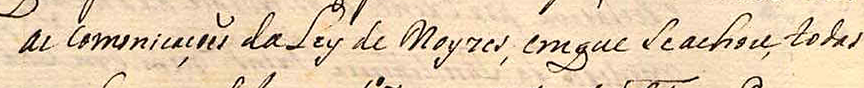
as comonicaçoẽs da Ley de Moyzes, em que se achou, todas
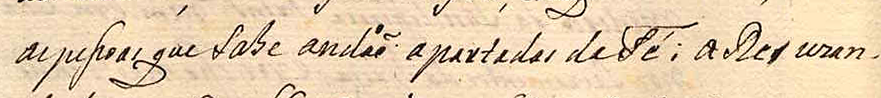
as pessoas que sabe andaõ apartadas da Fé: a Re_ uzan
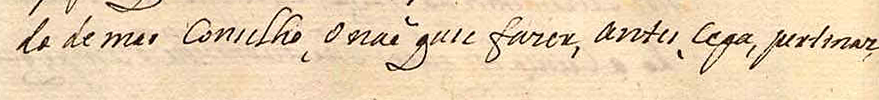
de de mao conselho, o naõ quis fazer, antes, cega, pertinaz,
